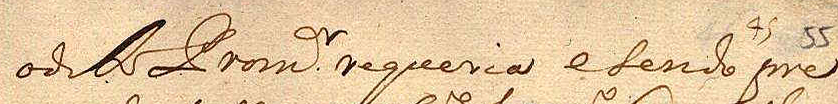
o dito Prom.or requeria e sendo pre
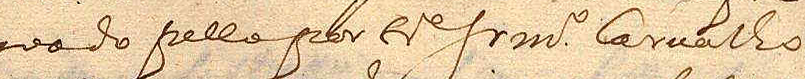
goado pello portro Jrm.o Carualho
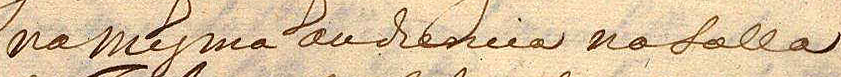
na mesma audiencia na salla
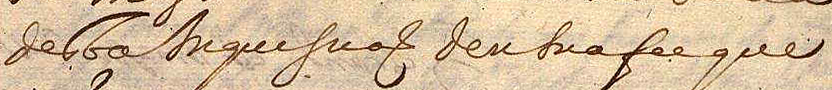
desta Inquisicaõ deu sua fee que
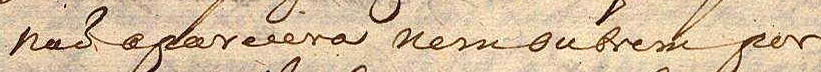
naõ aparecera nem outrem por
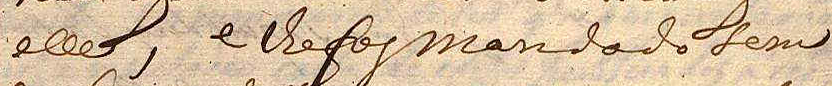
elle, e lhe foj mandado sem
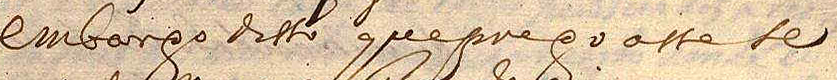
embargo disso que pregoasse se
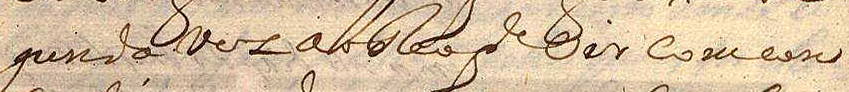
gunda vez ao Reo pa vir com con
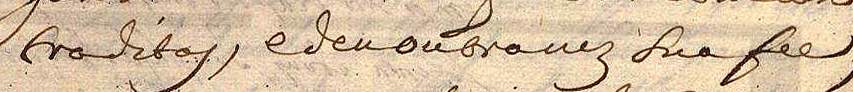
traditas, e deu outra uez sua fee
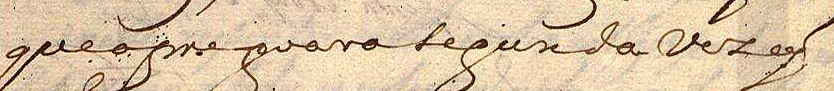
que apregoara segunda vez e q̄
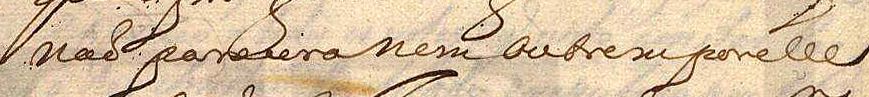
naõ parecera nem outrem por elle
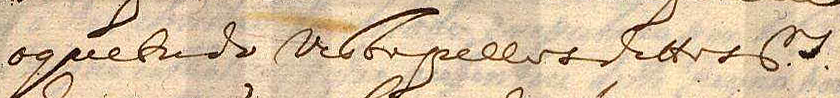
o que tudo visto pellos dittos s.res
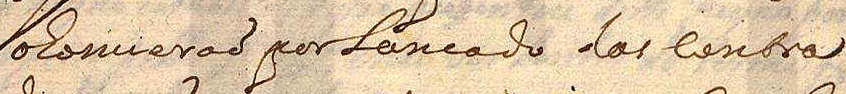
o houueraõ por Lancado das contra
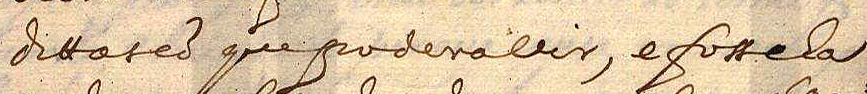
dittas cō que podera vir, e fosse ha
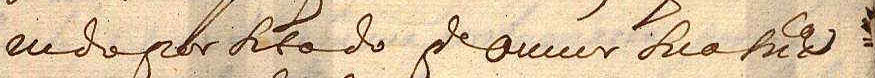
uido por sitado pa ouuir sua senca
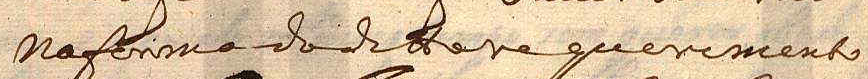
na forma do ditto requerimento
